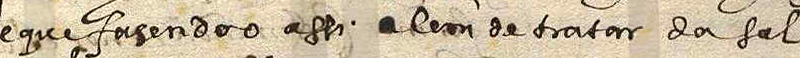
e que fazendoo assi _lem de tratar da sal
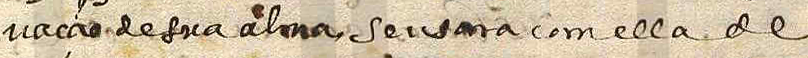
uação de sua alma se usara com ella de
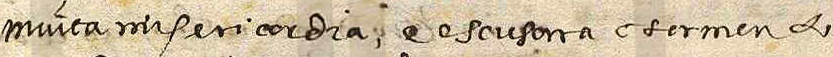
muita misericordia, e escusara o tormento
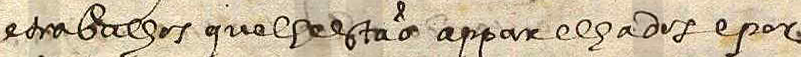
e trabalhos que lhe estaõ apparelhados e por
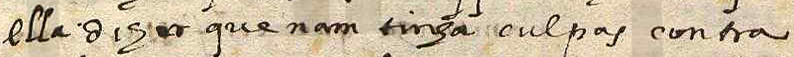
ella dizer que nam tinha culpas contra
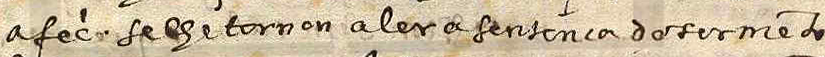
a feé se lhe tornou a ler a sentenca do tormēto
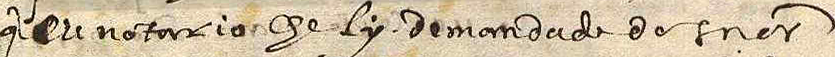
q̄ eu notario lhe ly de mandado do snor̄
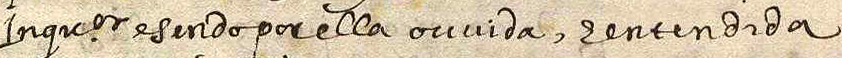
Inqu.or e sendo por ella ouuida, E entendida
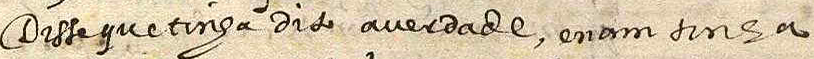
Disse que tinha dito a uerdade, e nam tinha
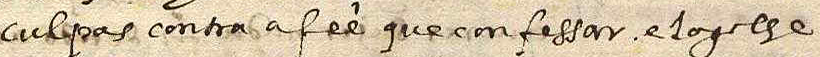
culpas contra a feé que confessar e logo lhe
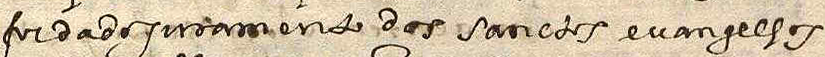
foi dado juramento dos santos euangelhos
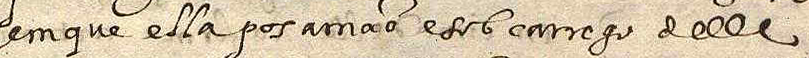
em que ella pos maõ e sob carrego delle
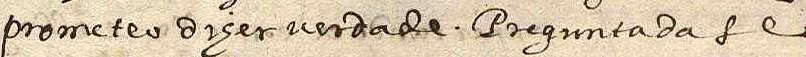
prometeo dizer uerdade. Preguntada se
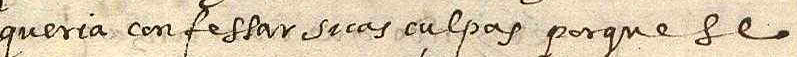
queria confessar suas culpas porque se
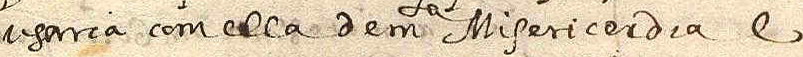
usaria com ella de mta Misericordia e
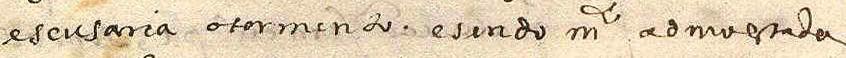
escusaria o tormento. e sendo mto admoestada
